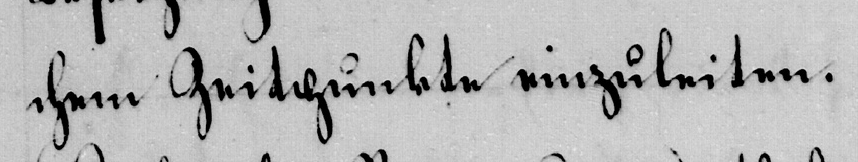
chem Zeitpunkte einzuleiten.
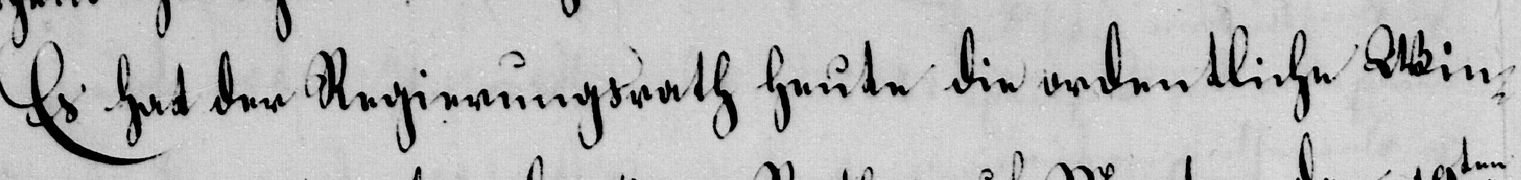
Es hat der Regierungsrath heute die ordentliche Win¬
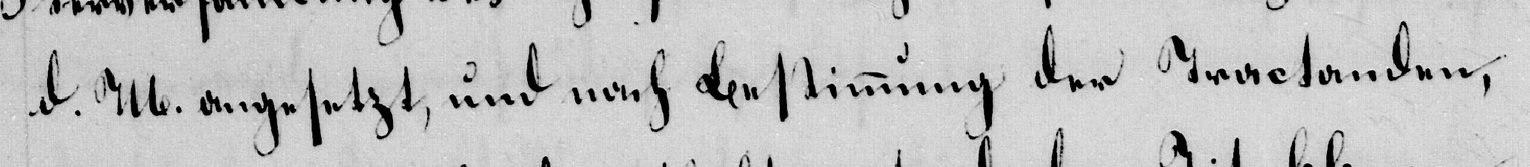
d. M. angesetzt, und nach Bestimmung der Tractanden,
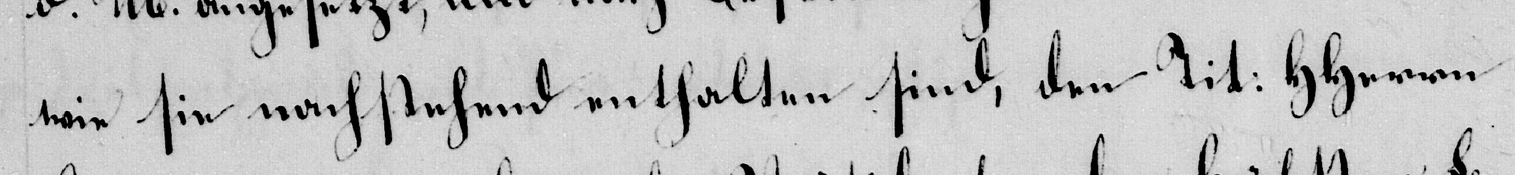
wie sie nachstehend enthalten sind, den Tit: HHerren
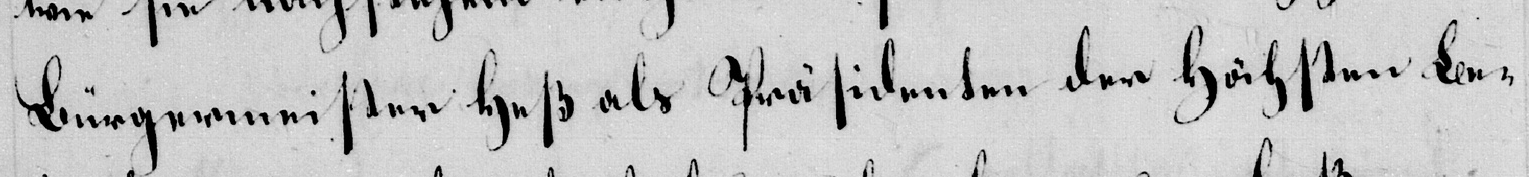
Bürgermeister Heß als Präsidenten der Höchsten Be¬
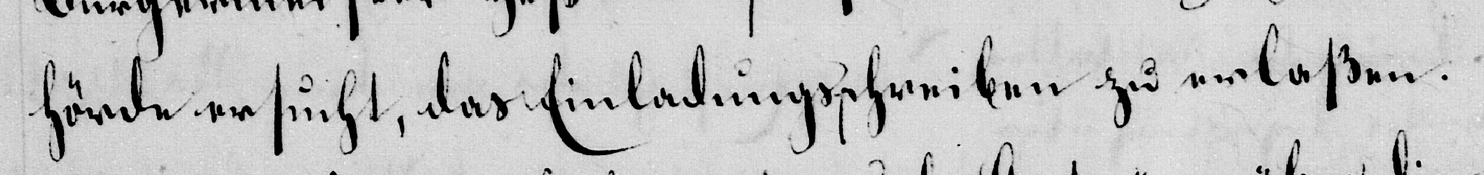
hörde ersucht, das Einladungsschreiben zu erlaßen.
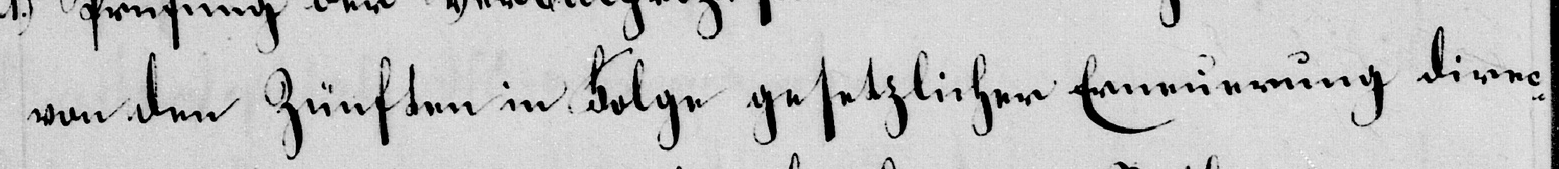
von den Zünften in Folge gesetzlicher Erneuerung dire¬
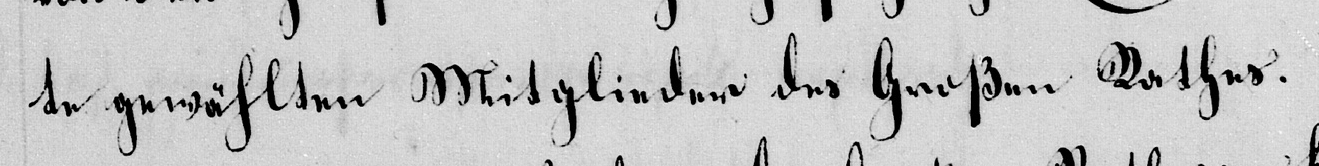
cte gewählten Mitglieder des Großen Rathes.
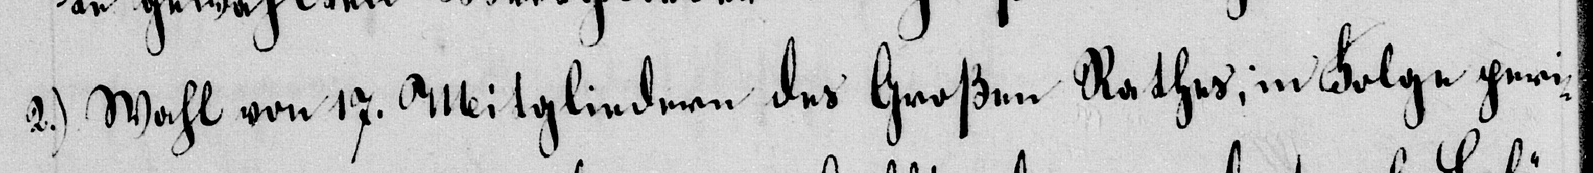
2.) Wahl von 17. Mitgliedern des Großen Rathes, Folge peri¬
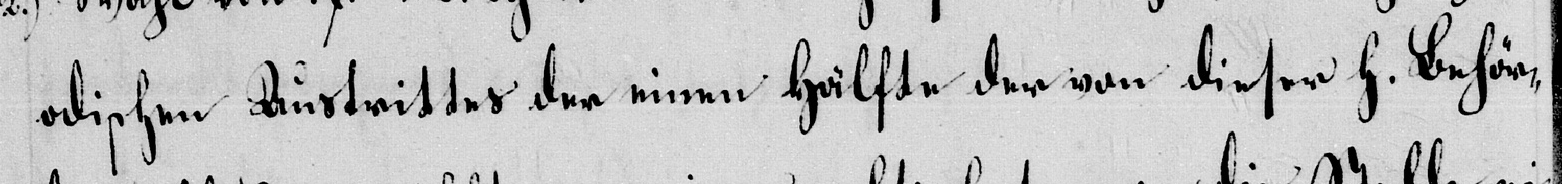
odischen Rücktrittes der einen Hälfte der von dieser H. Behör¬
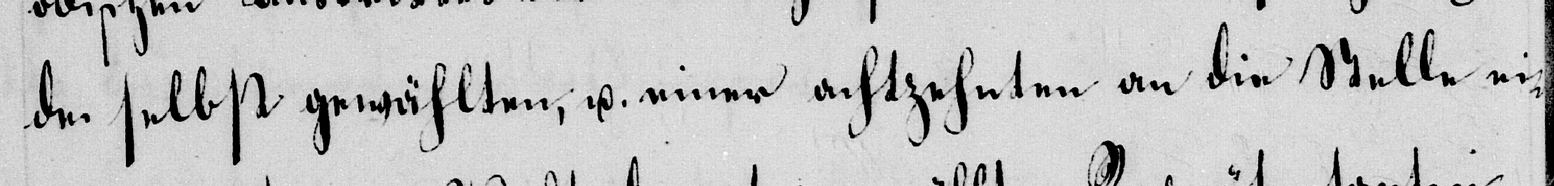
de selbst gewählten, u. einer achtzehnten an die Stelle ei¬
